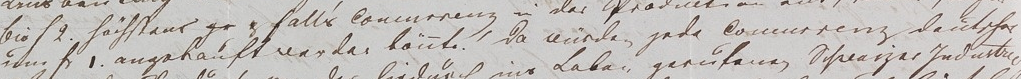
um fr 1. angekauft werden könnte! Da würden jede Concurrenz deutscher
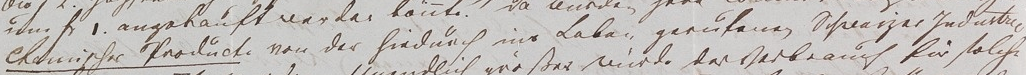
chemischer Producte von der hiedurch ins Leben gerufenen Schweizer Industrie
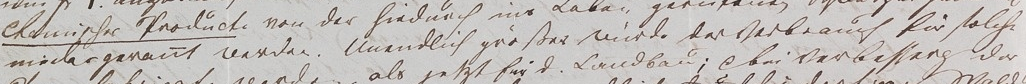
niedergerannt werden. Unendlich größer würde der Verbrauch für solche
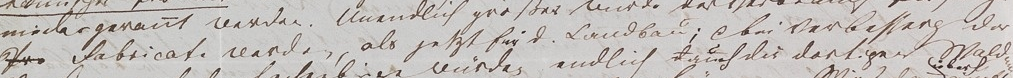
Pr Fabricate werden, als jetzt für d. Landbau; & bei Verbesserg der
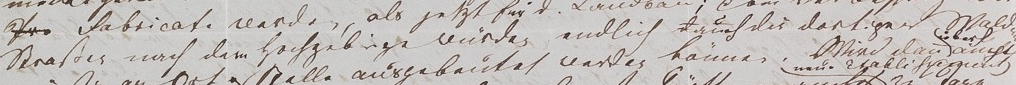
Straßen nach dem Hochgebirge würden endlich dauch die dortigen Waldungen
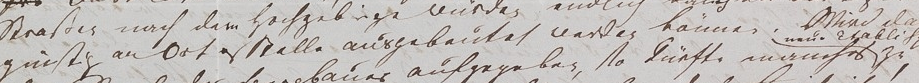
günstig an Ort & Stelle ausgebeutet werden können. Wird dann
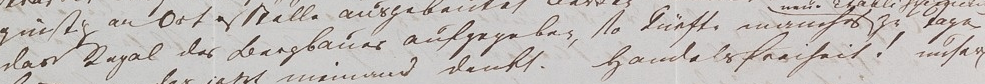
das Regal des Bergbaues aufgegeben, so dürfte manches neue Etablissement zu
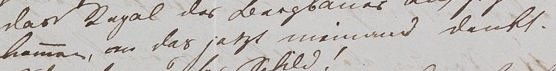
kommen, an das jetzt niemand denkt.
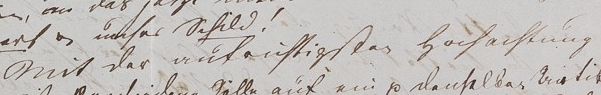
Mit der aufrichtigsten Hochachtung
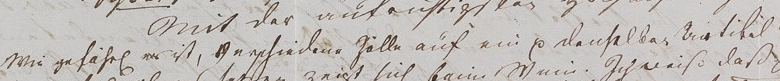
Wie gefährlich es ist, verschiedene Zölle auf ein & denselben Artikel
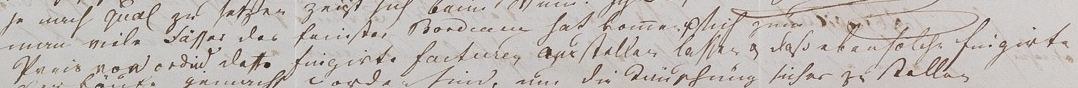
Preis von ordinn daffo fingirte facturen ausstellen lassen & daß ebensolche fingirte
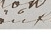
zustellen.
